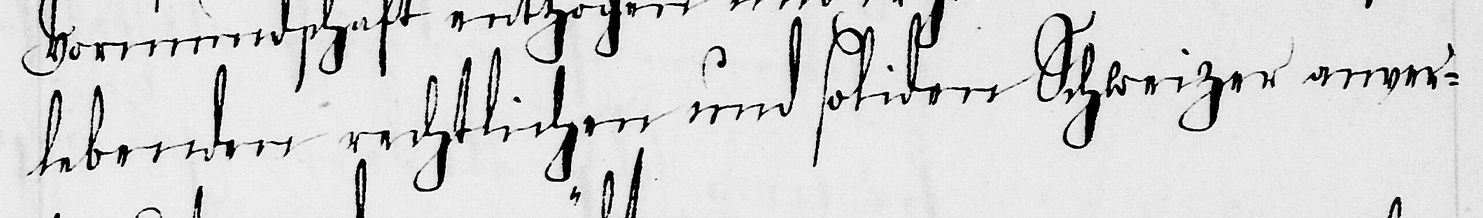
lebenden rechtlichen und soliden Schweizer anver¬
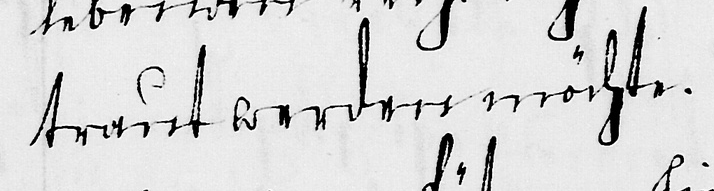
traut werden möchte.
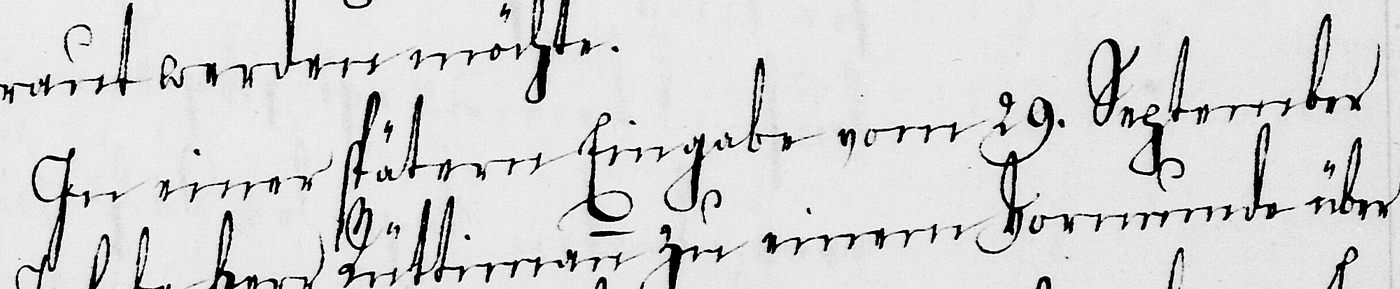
In einer spätern Eingabe vom 29. September
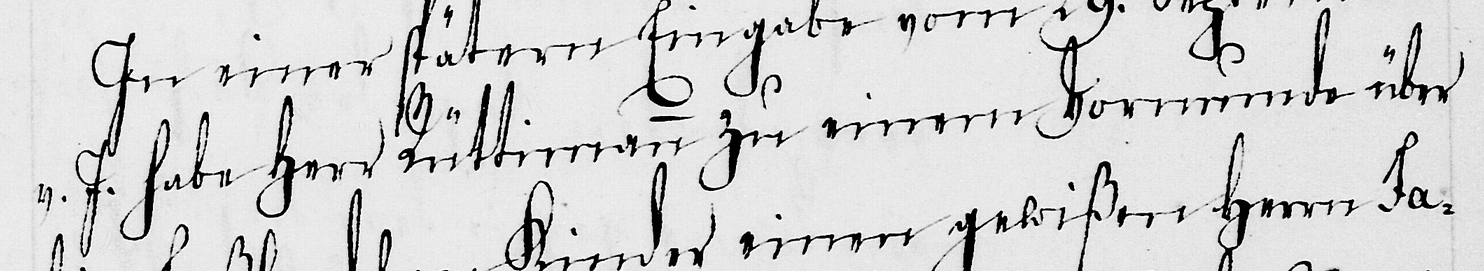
v. J. habe Herr Rüttimann zu einem Vormunde über
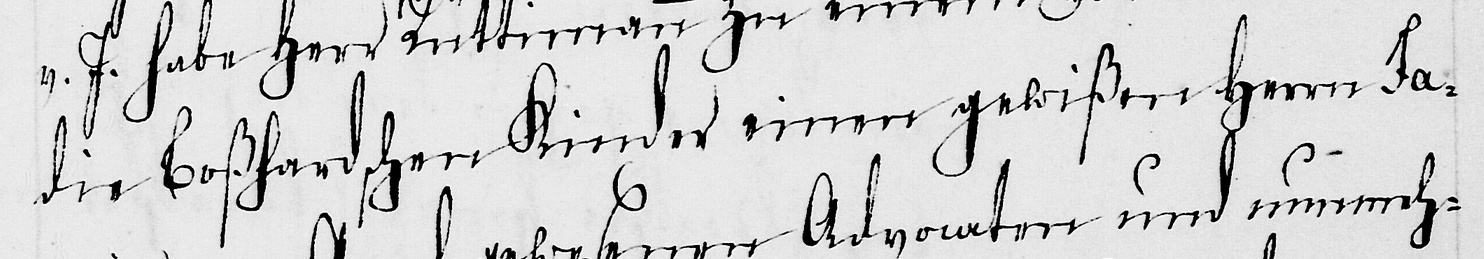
die Boßhardschen Kinder einen gewißen Herrn Ja¬
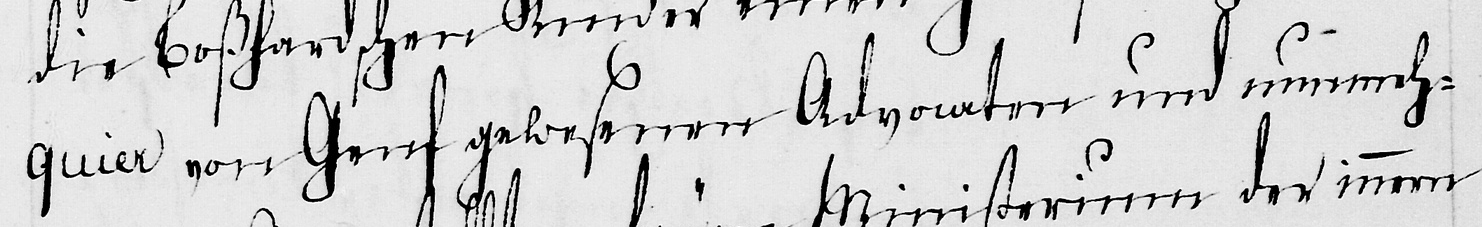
quier von Genf gewesenen Advocaten und nunmeh¬
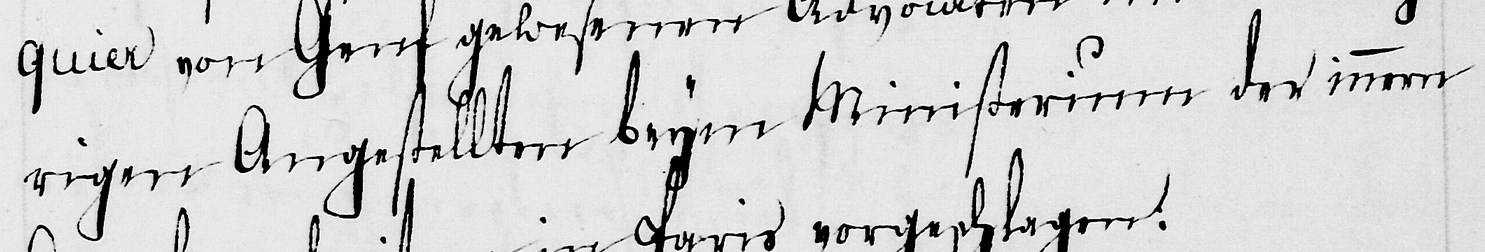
rigen Angestellten beym Ministerium der innern
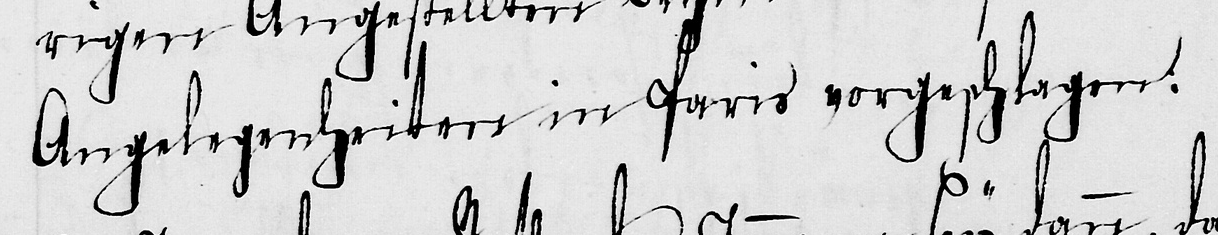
Angelegenheiten in Paris vorgeschlagen.
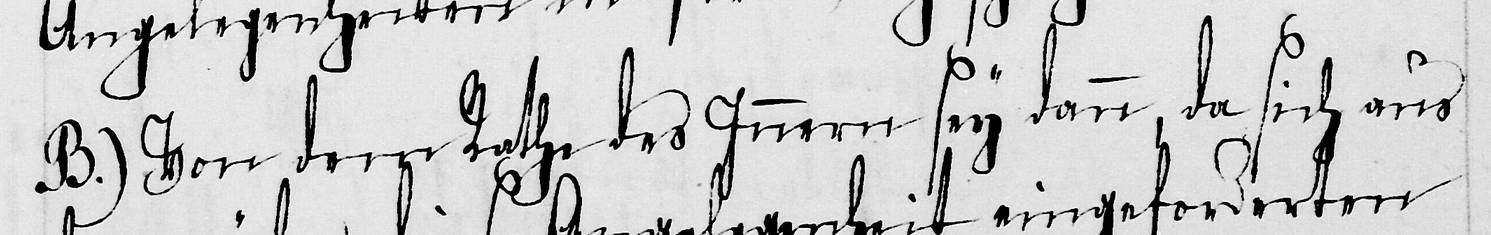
B.) Von dem Rathe des Innern sey dann, da sich aus
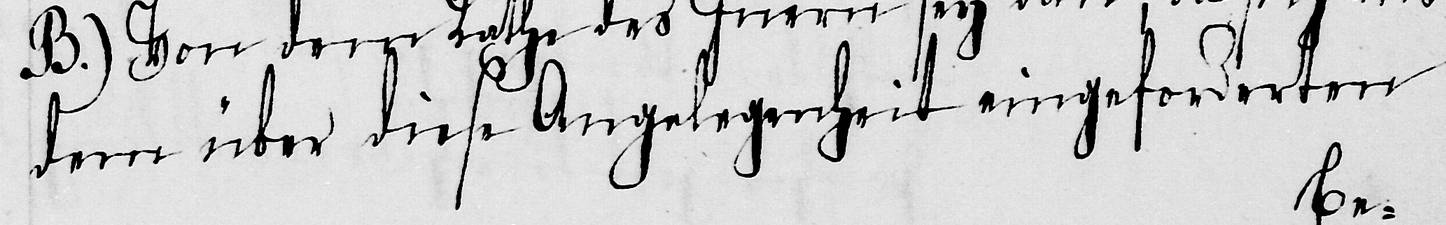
dem über diese Angelegenheit eingeforderten
